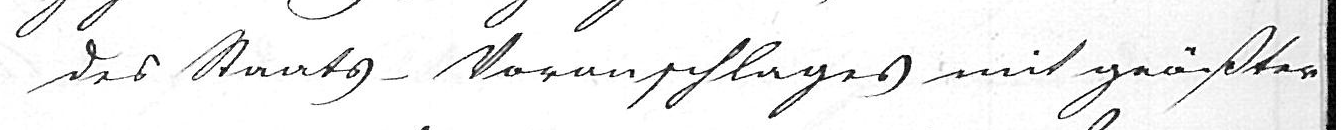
des Staats-Voranschlages mit größter
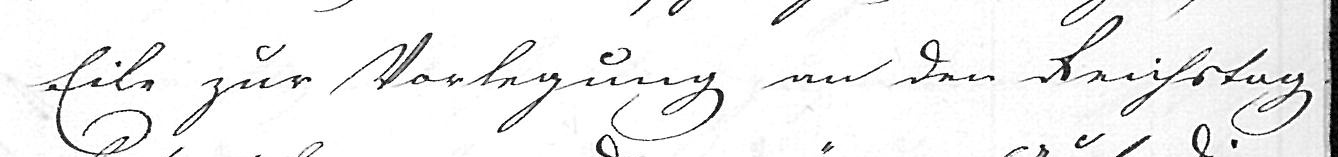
Eile zur Vorlegung an den Reichstag
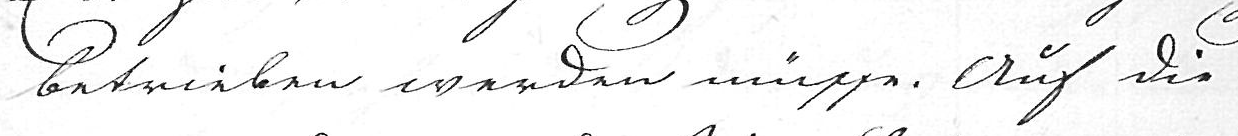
betrieben werden müsse. Auf die
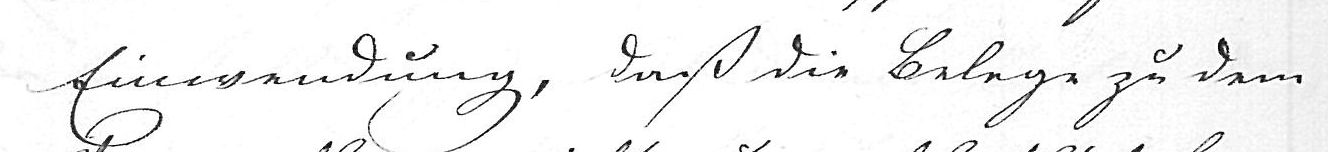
Einwendung, daß die Belege zu dem
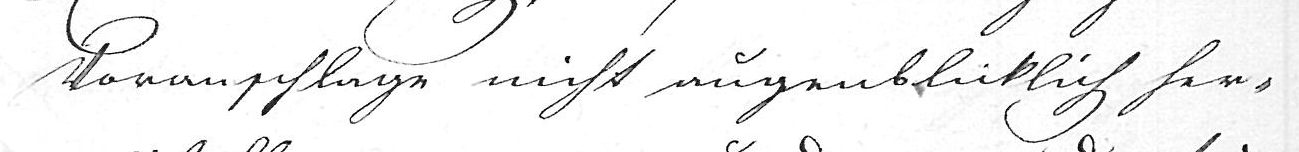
Voranschlage nicht augenblicklich her-
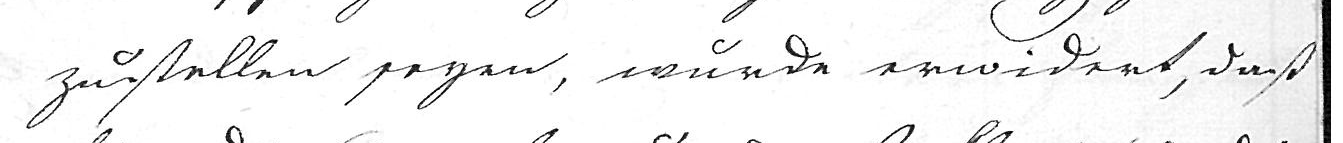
zustellen seyen, wurde erwidert, daß
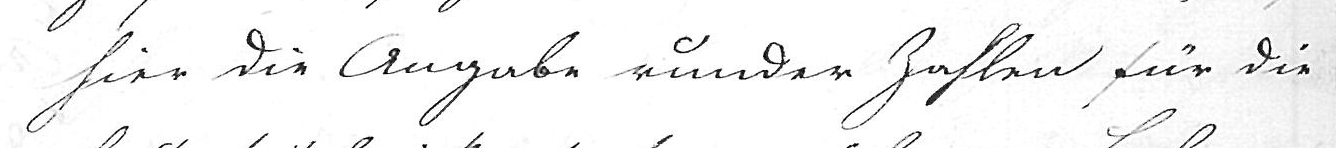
hier die Angabe runder Zahlen für die
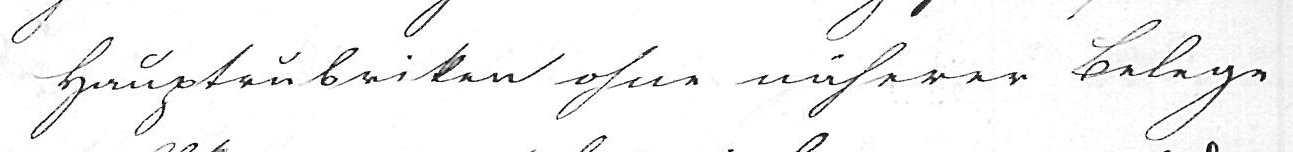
Hauptrubriken ohne näherer Belege
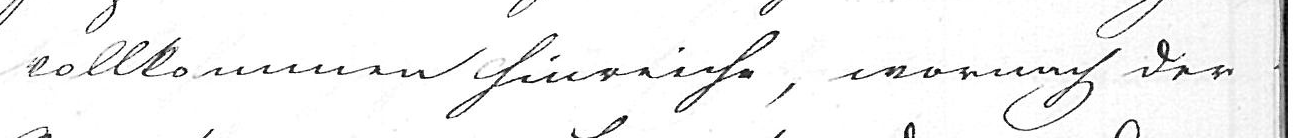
vollkommen hinreiche, wornach der
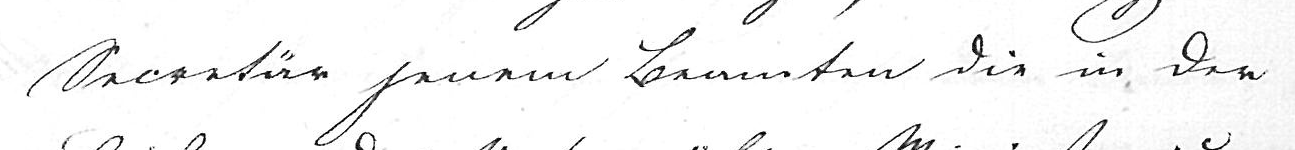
Secretär jenem Beamten die in der
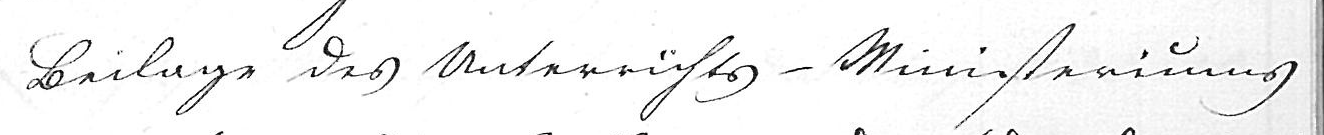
Beilage des Unterrichts-Ministeriums
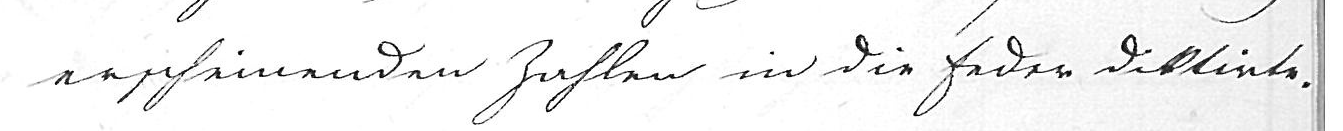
erscheinenden Zahlen in die Feder diktirte.
